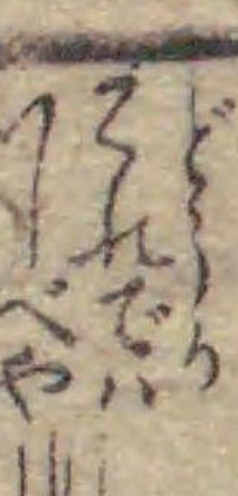これでき
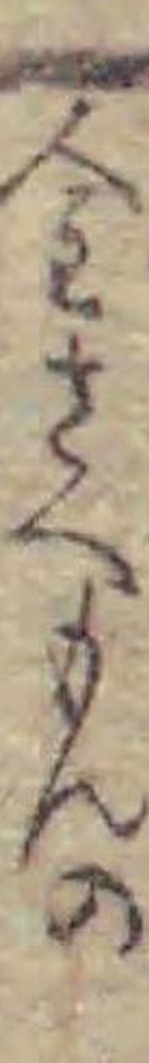金さへもんの
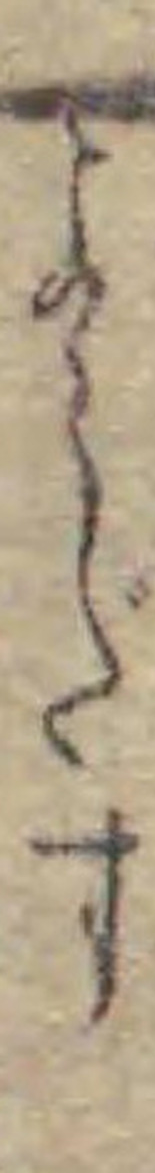ようだす

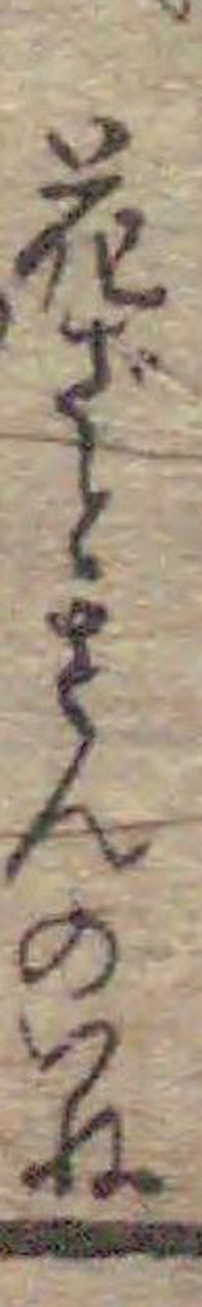花ざとさんのいね
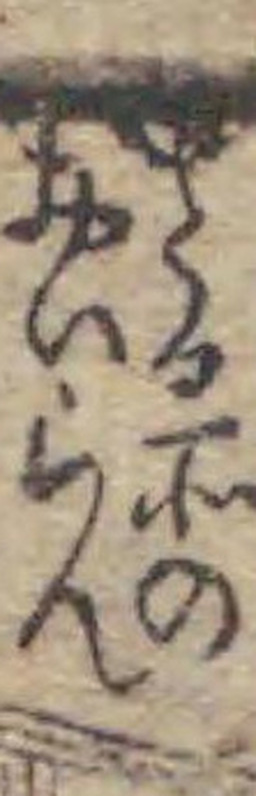おいらん
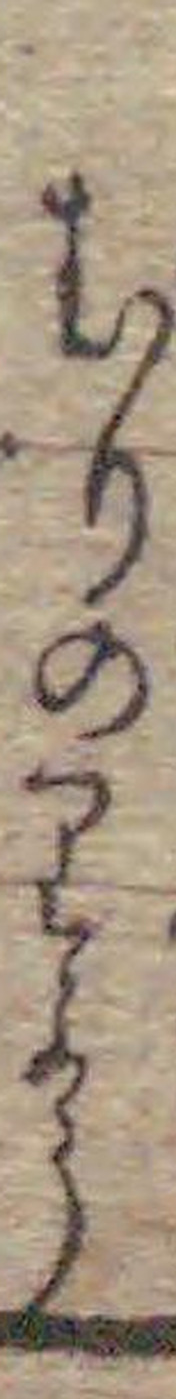むりのりよう
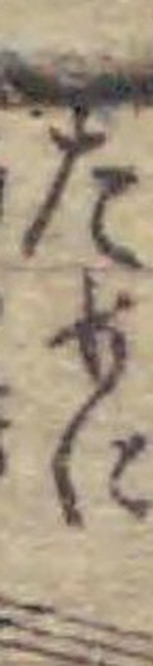ために
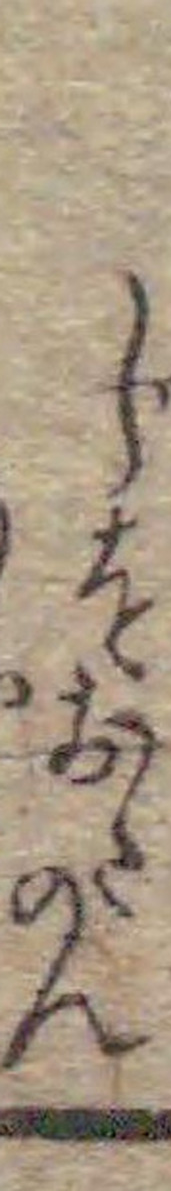じをおたのん
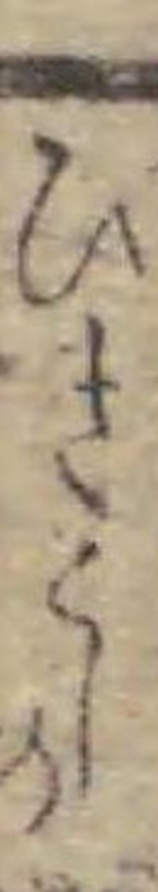ひきこしの
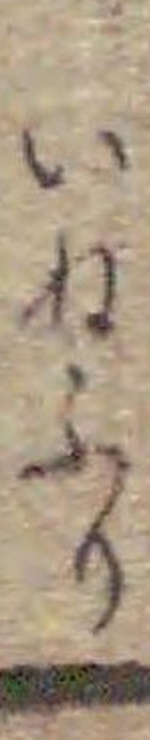いねふり
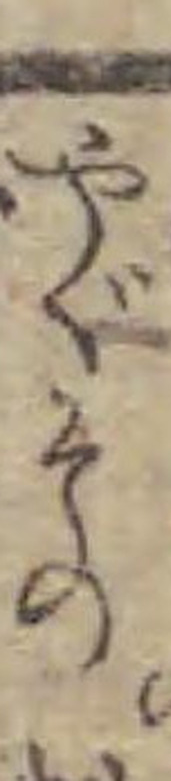やぐその
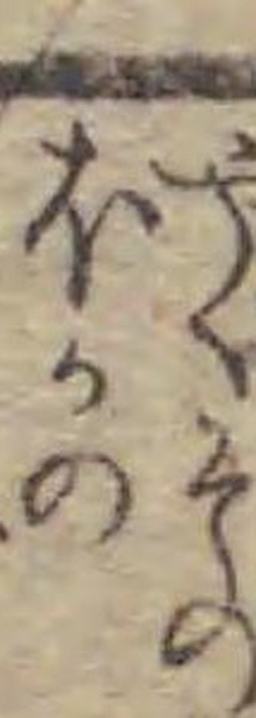ほかの
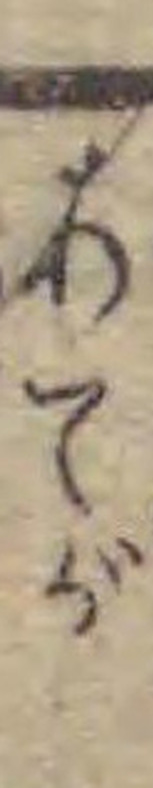あてが
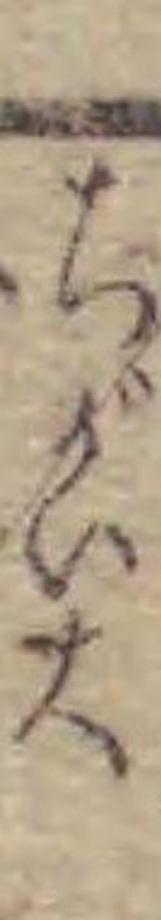ちがい大
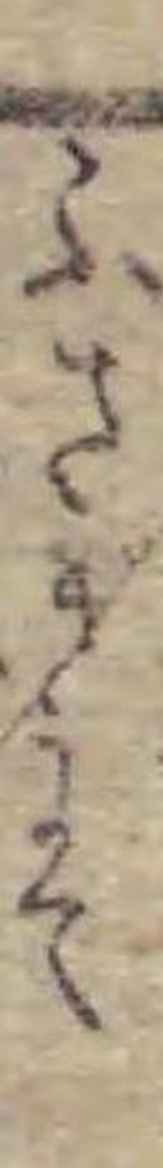ふさぎにて
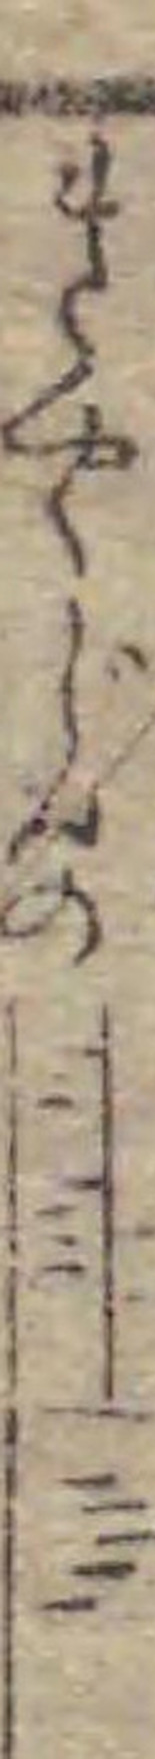きやくじんの
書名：江戸花俳優贔屓 : 3巻
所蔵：国立国会図書館 National Diet Library, JAPAN
